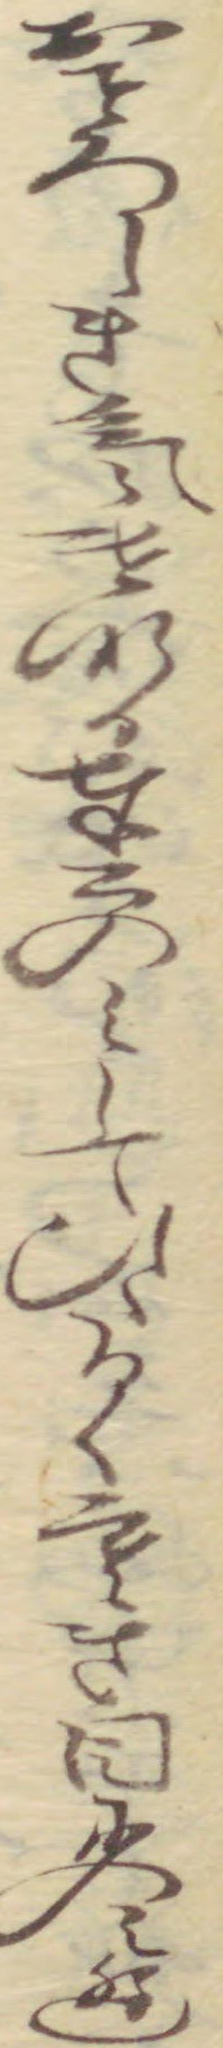おそろしき気遣なる奉公のみしてひたるく寒き目にのみ逢
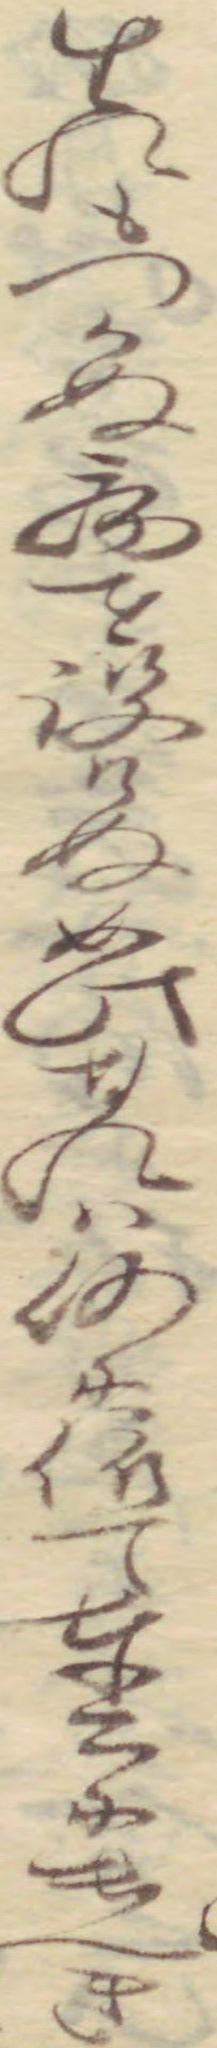生れもつかぬ病を設けぬ如此なれは何に依て奉公に出へき
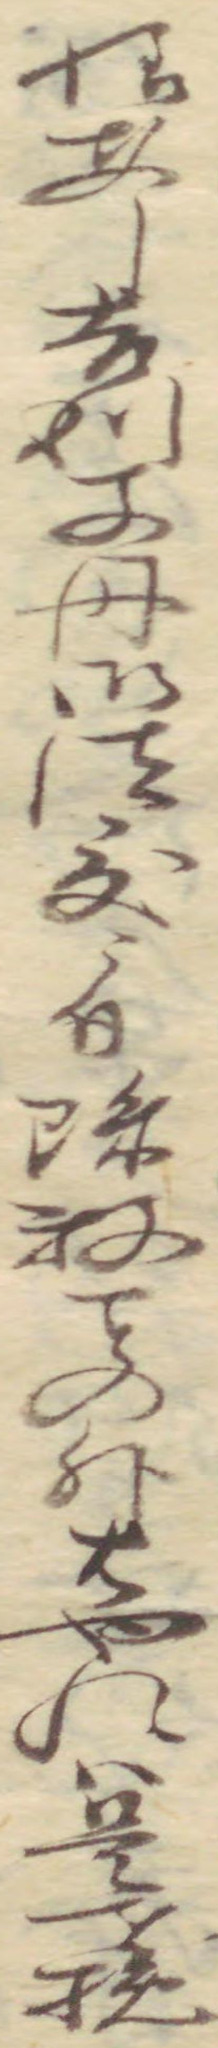様なし吉利支丹御法度ニ付珠数ことの外はやれは是を挽
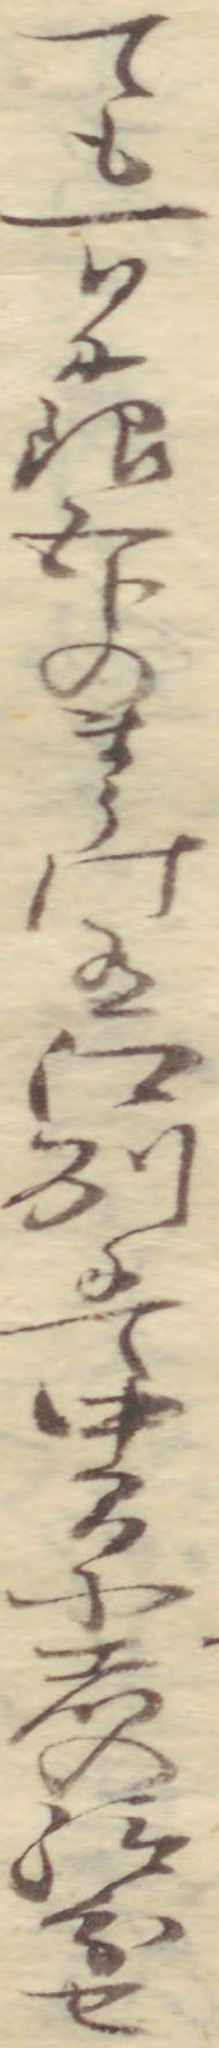ても一日に銀五分のまうけ有江州にて中間小者の給分せ
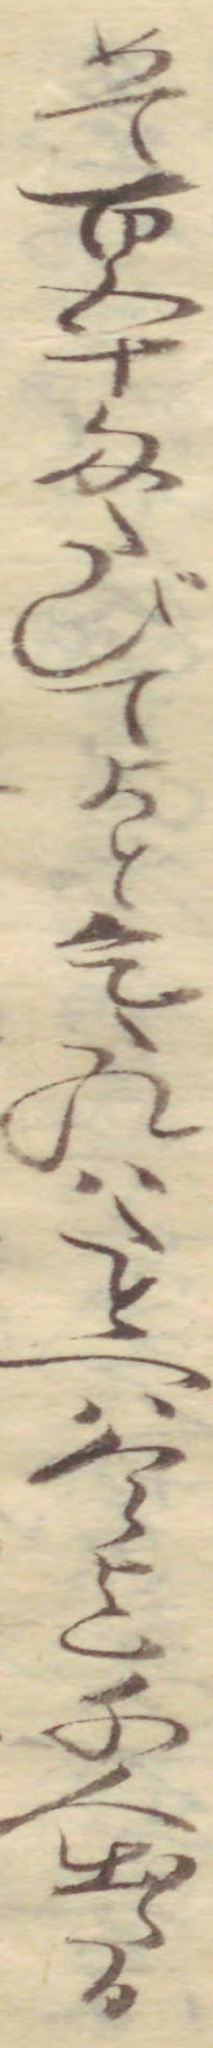めて百五十匁たびてよと乞たれはたとへは今迄千人出たる
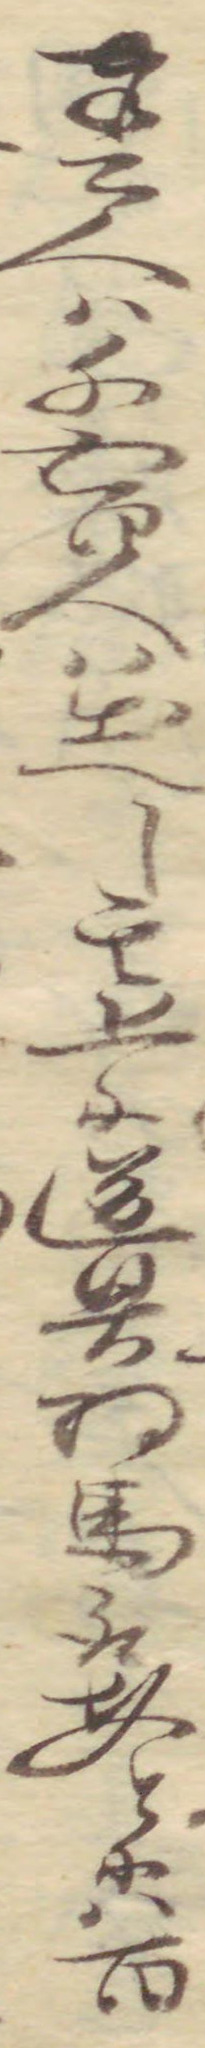奉公人は千五百人は出へし其上に道具持馬取なとには百
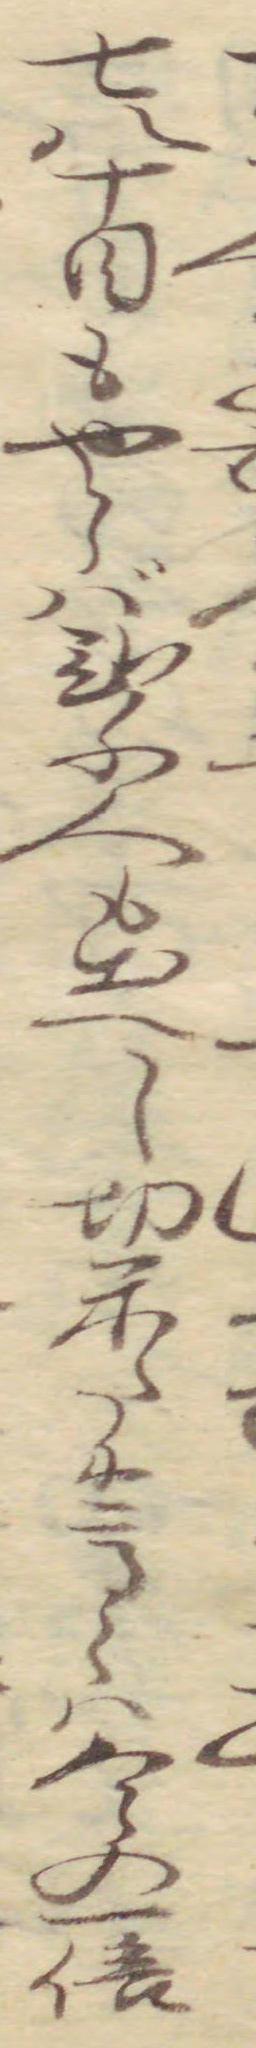七八十目もやらば弐千人も出へし切米たに高くは今の一倍
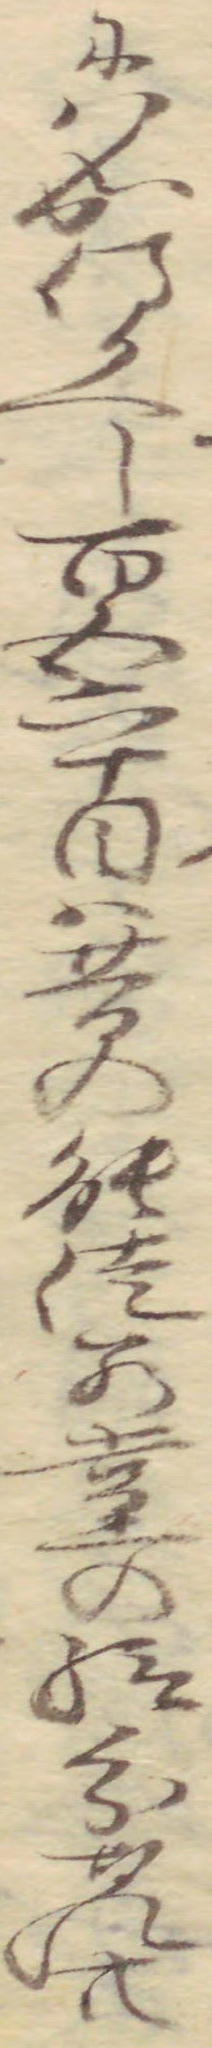には成侍るへし百五六十目は昔の能徒若堂の給分なれ共
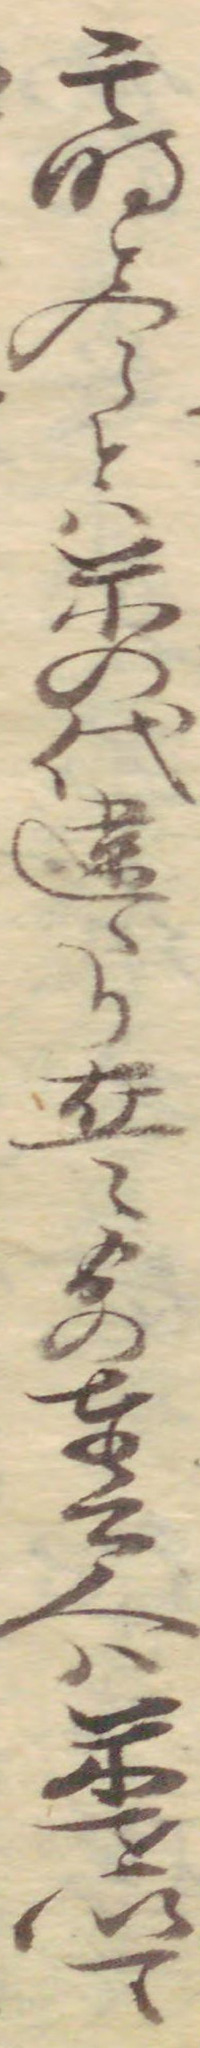其時と今とは米の代違たり在〻ゟの奉公人は米を以て
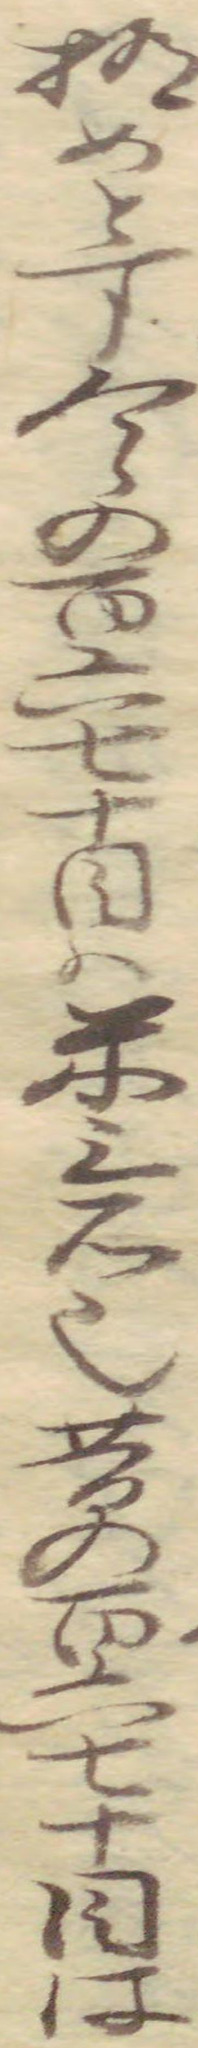極めとす今の百六七十目は米三石也昔の百六七十目は
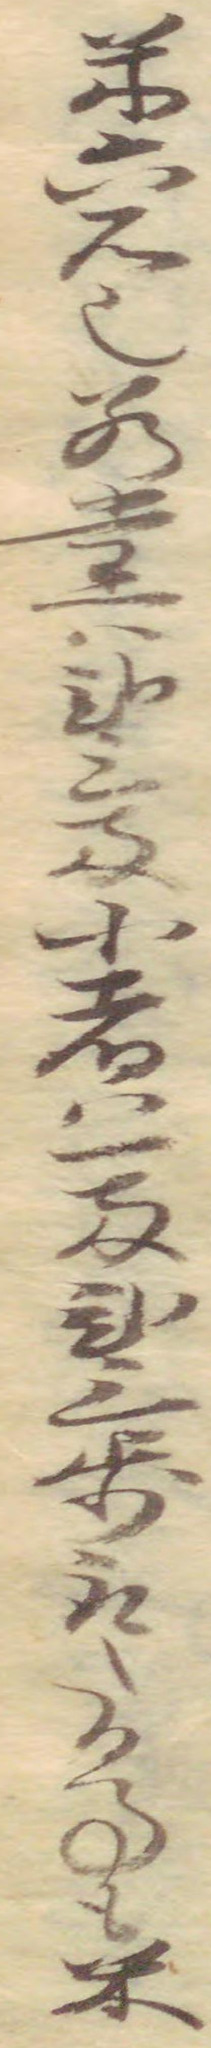米六石也若堂は弐三両小者は一両弐三歩取たる事も米

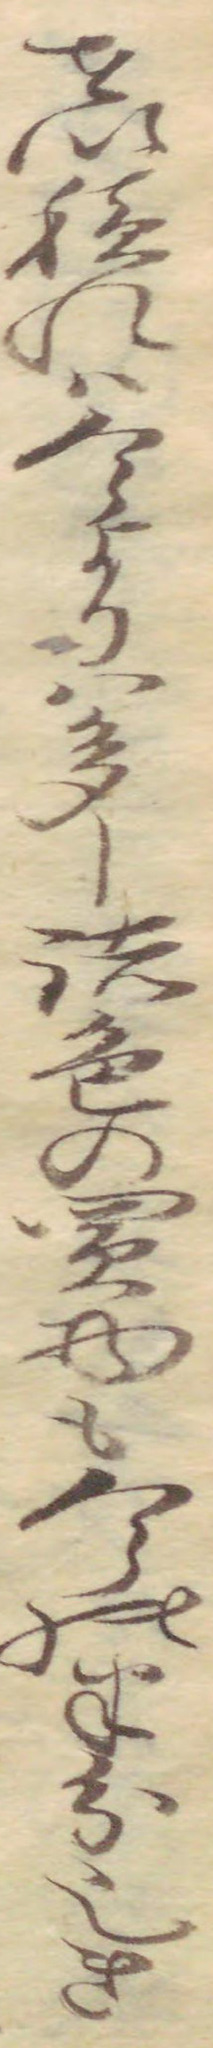を以積れは今よりは多し諸色の買物も今の半分也き
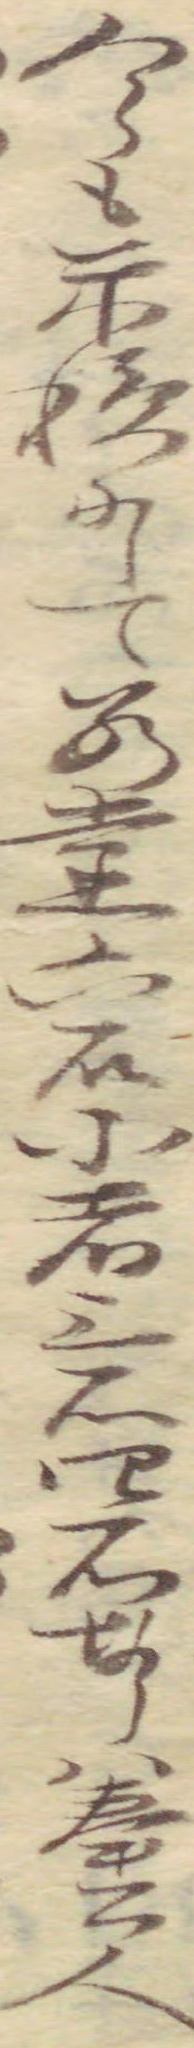今も米積にして若党六石小者三石四石ならは奉公人
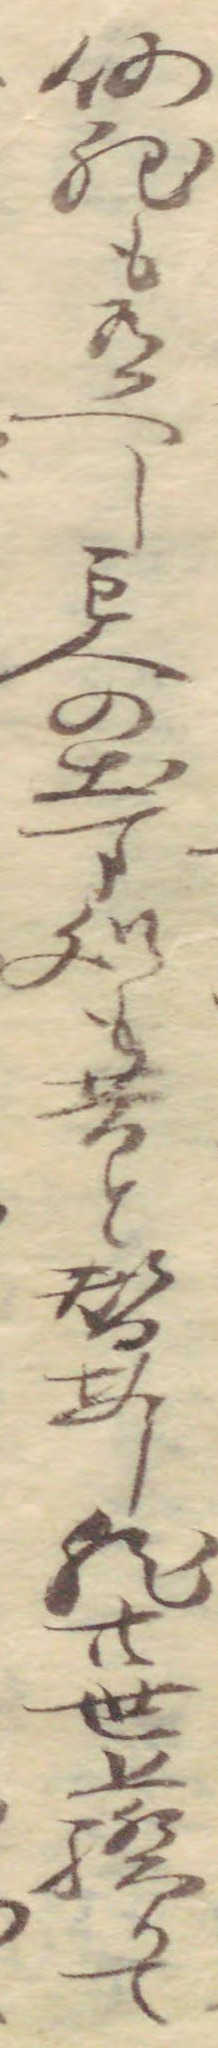何程も有へし主人の出す処も昔と替なし然共世上驕りて
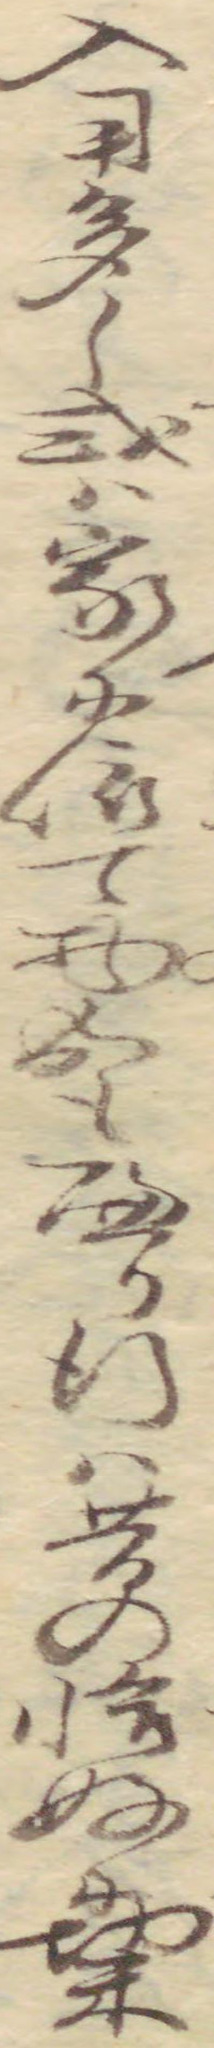入用多く或は家に依て物成もへり行は昔の恪好に切米
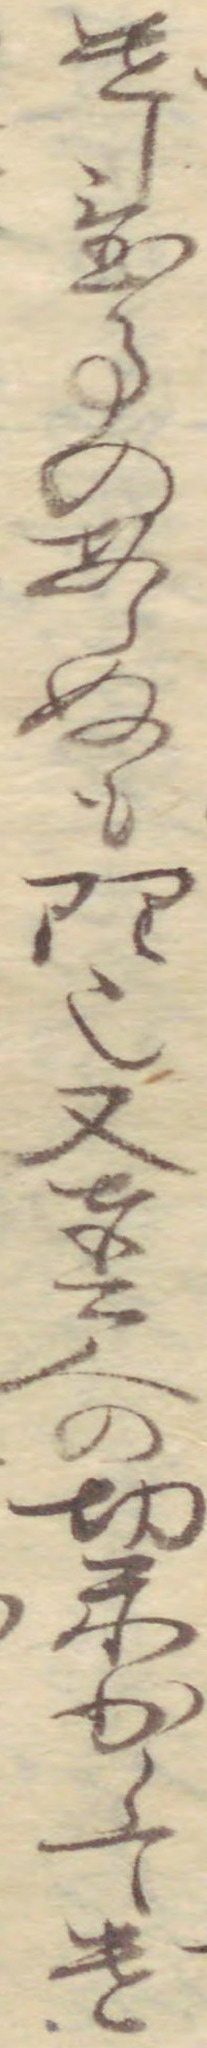遣し置事のならぬも理也又奉公人の切米少くて遣
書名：鶯宿雑記. 巻263-264
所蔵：国立国会図書館 National Diet Library, JAPAN
